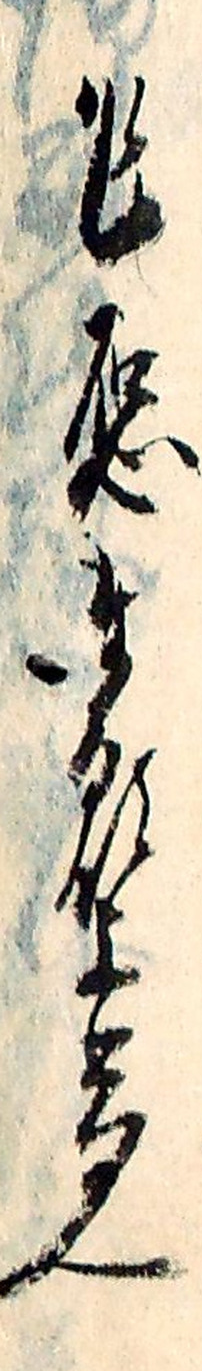乍恐奉願上覚
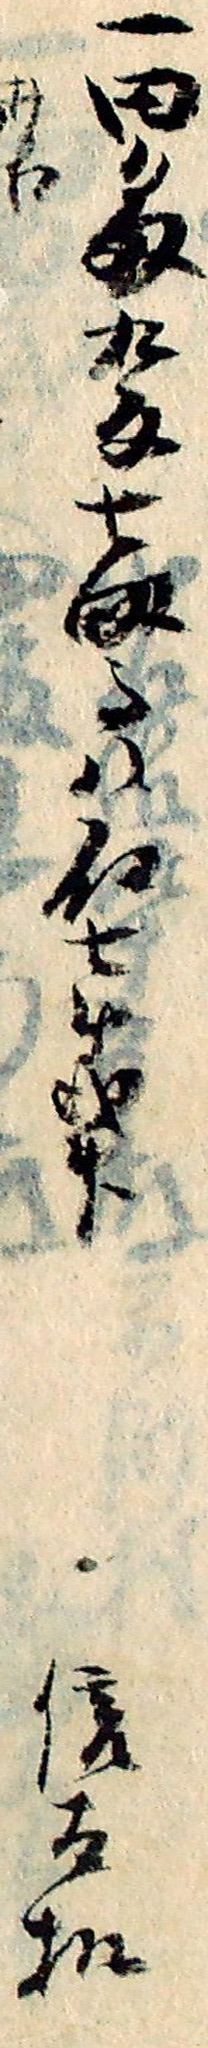一田畠九反七畝高八石七斗弐升信太扣
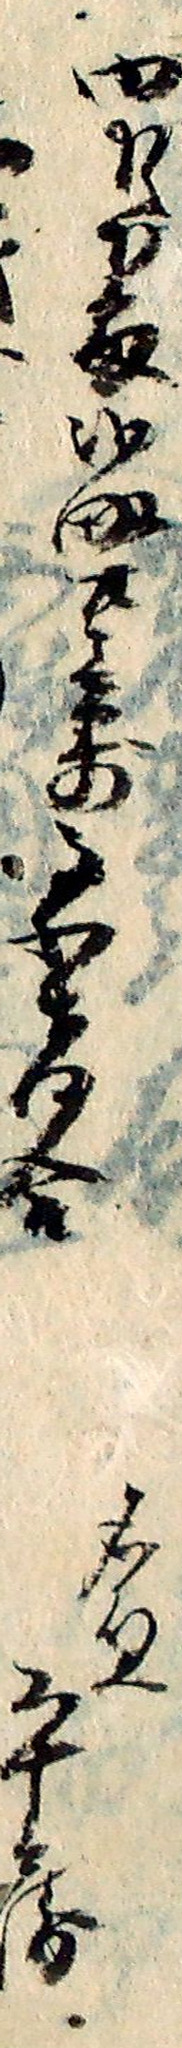内下々下畠弐畝廿壱歩高五升四合平兵衛
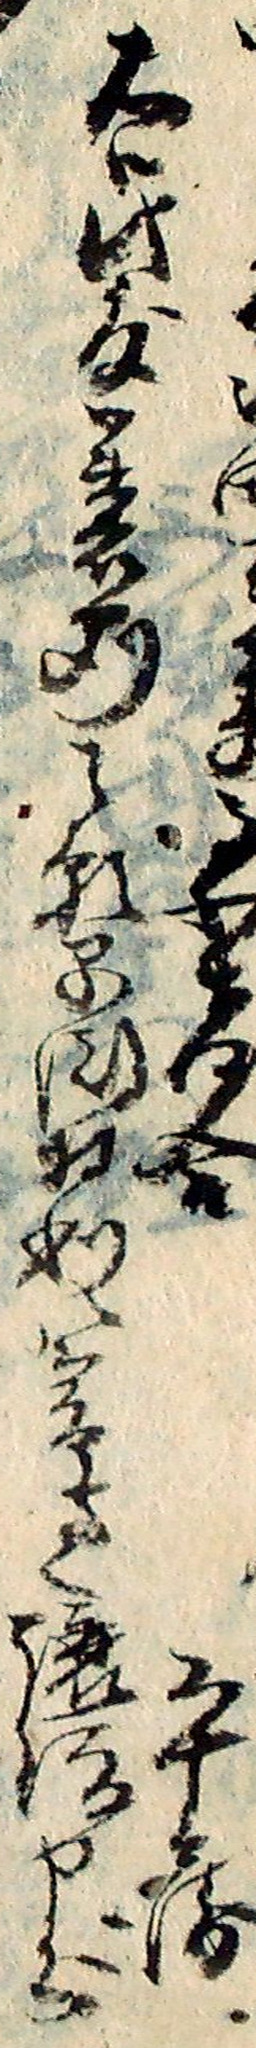右は此度御裏判之願早淵村利八郎方へ譲渡申分
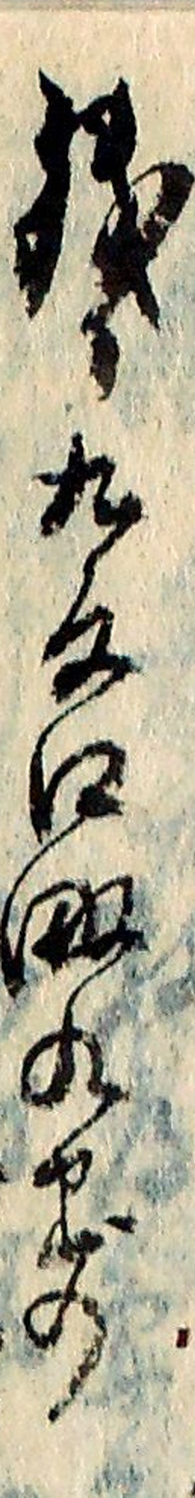残て九反四畝九歩
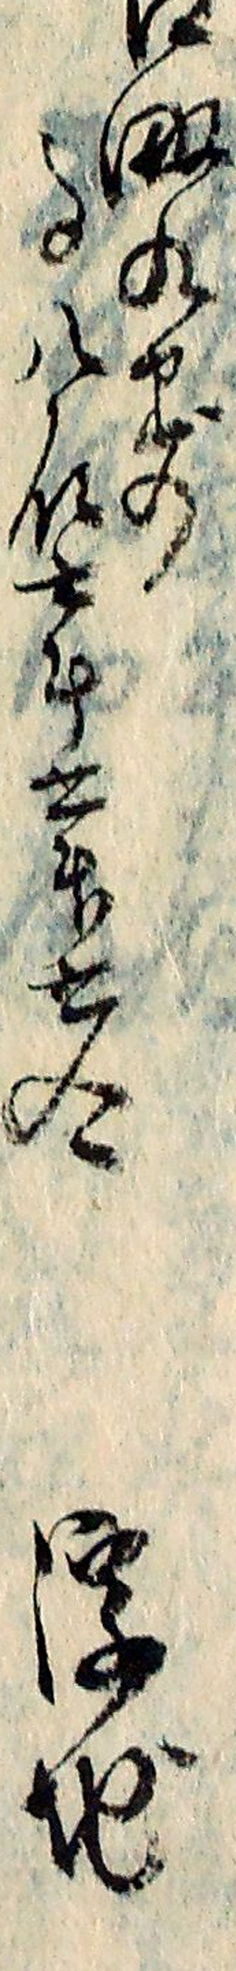高八石六斗六升六合浮地
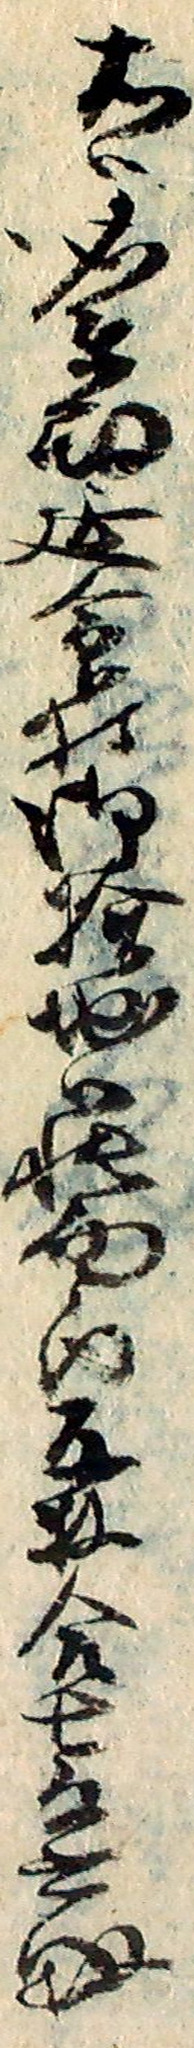右は名東郡延命村御検地御帳面之内反数合七反六畝
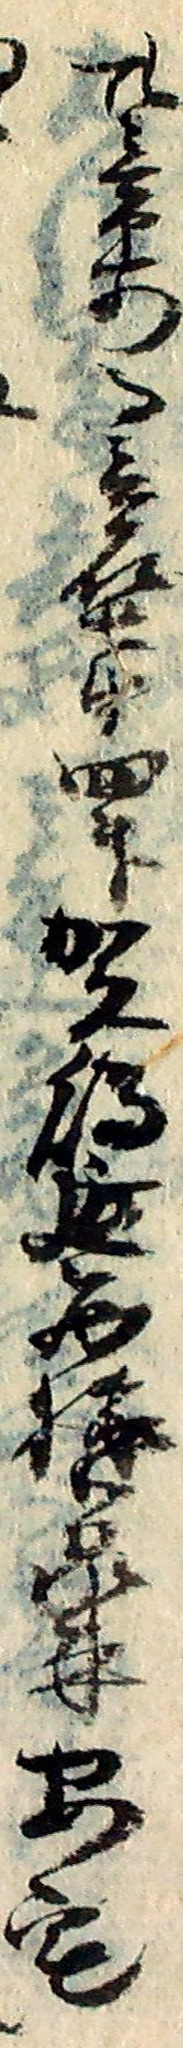廿壱歩高壱石七斗四升賀島延為様御家来安宅
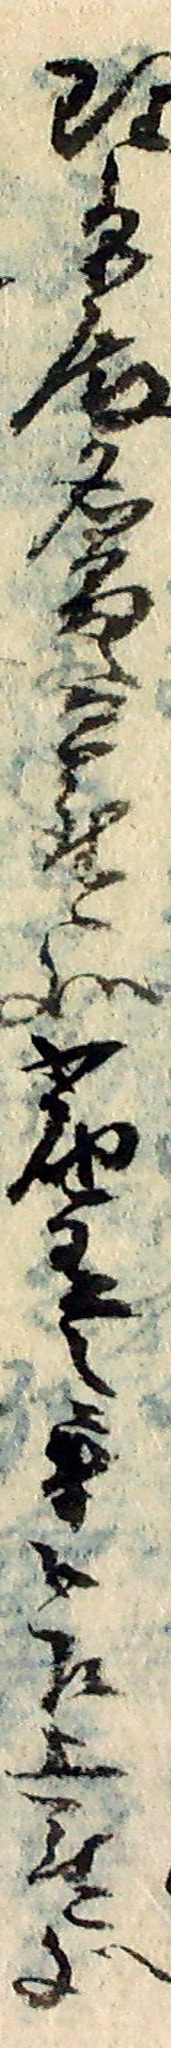理兵衛殿名畠にて御座候処不届有之に付被召上御座候処
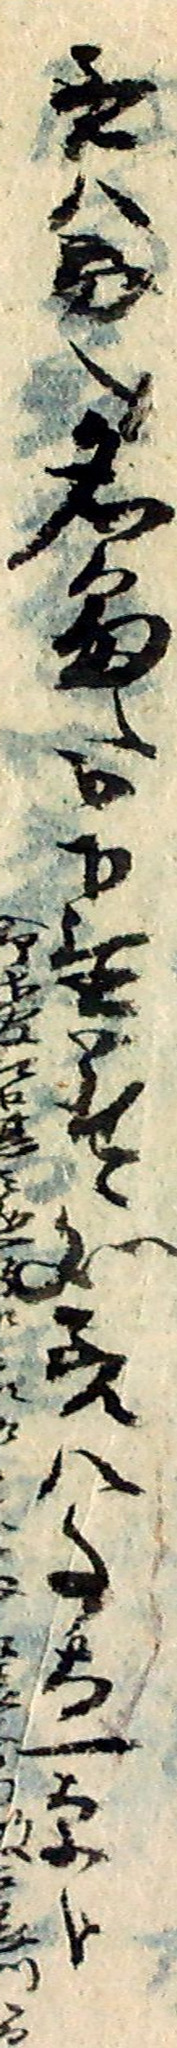善八方へ名畠へ被下置御座候処善八事与一兵衛と
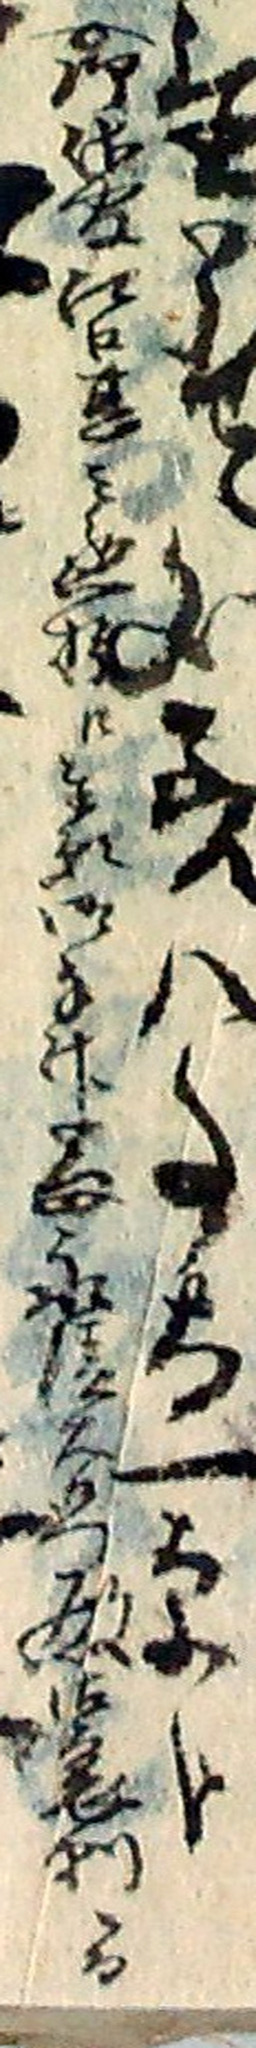御代官江口甚之丞様え奉願御手代富永清右衛門殿御裏判にて
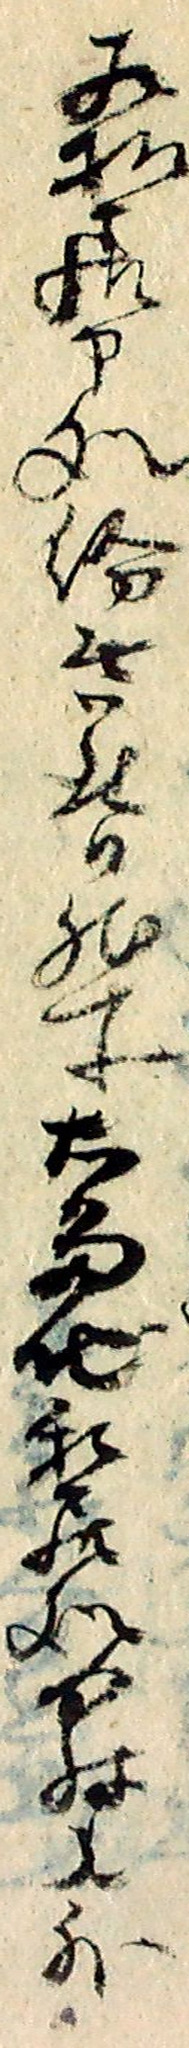相扣居申処紛無御座候然所右畠地私居処ゟ殊之外
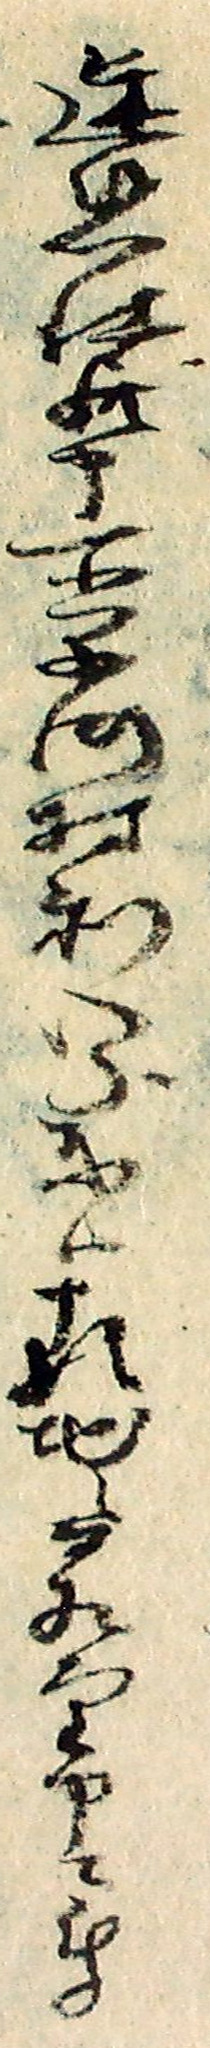迷惑仕居申所早淵村利八郎義は頼地にて相望申に付
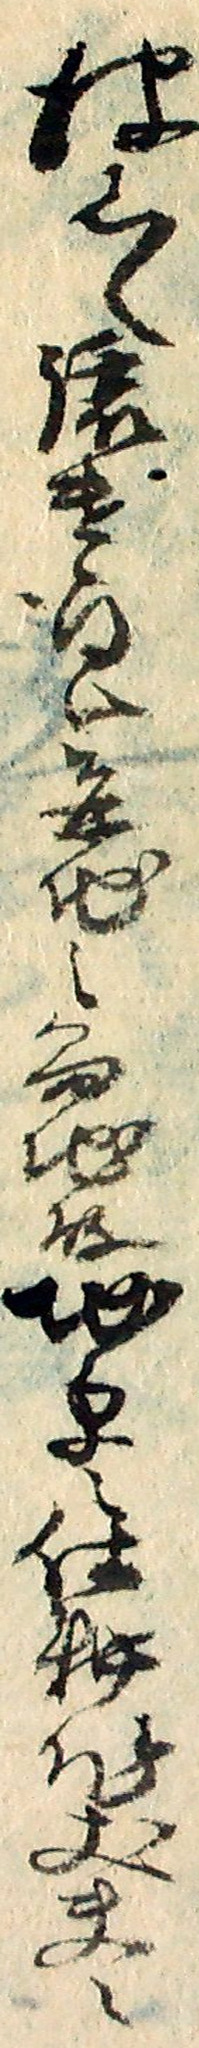彼者へ譲遣候得は並地之畠地故地早々仕耕作丈夫に
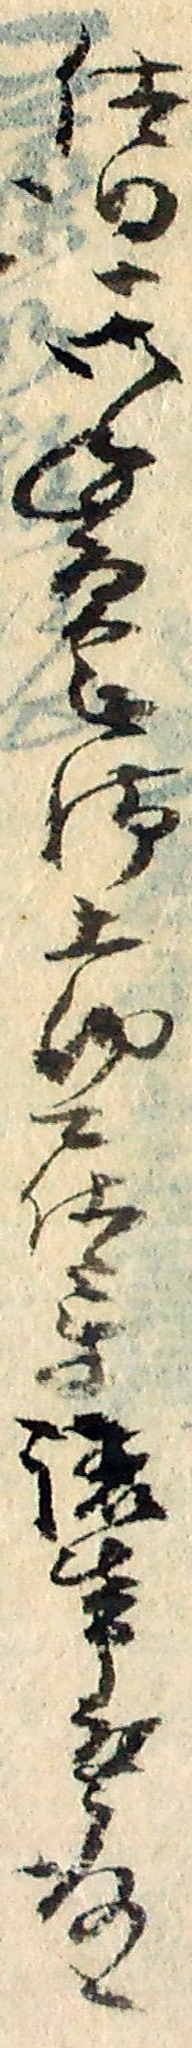仕候得は御年貢無滞上納可仕候に付譲遣申度奉存候
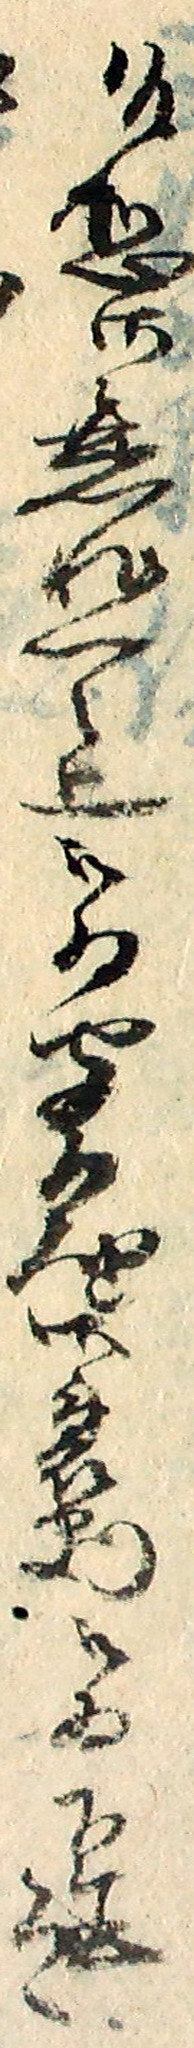乍恐御慈悲之上被為聞召届御裏判被為下置候はゝ
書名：諸御願書控(後藤氏壱番）
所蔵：鳴門教育大学 Naruto University of Education
